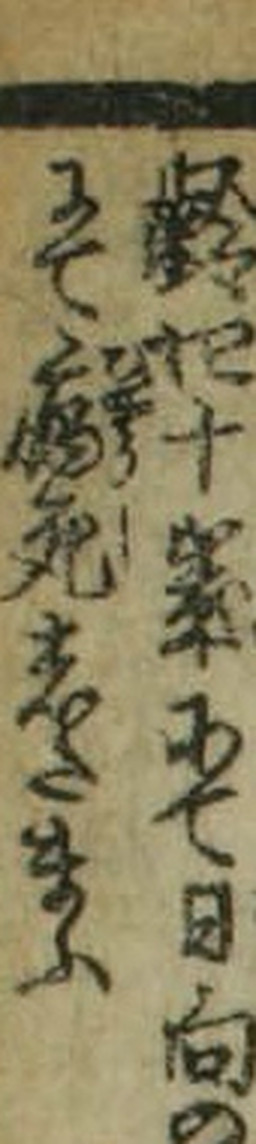にて病死したまふ
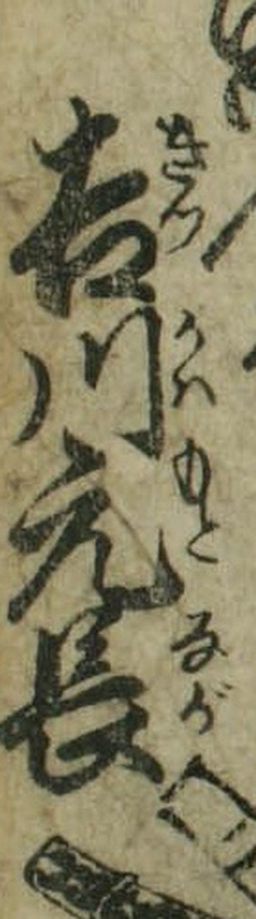吉川元長

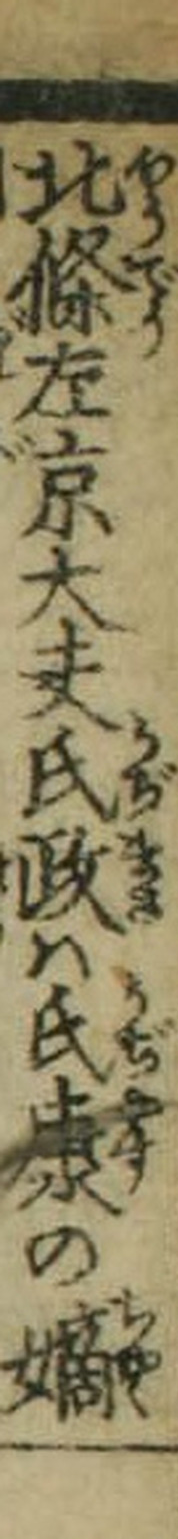北條左京大夫氏政は氏康の嫡
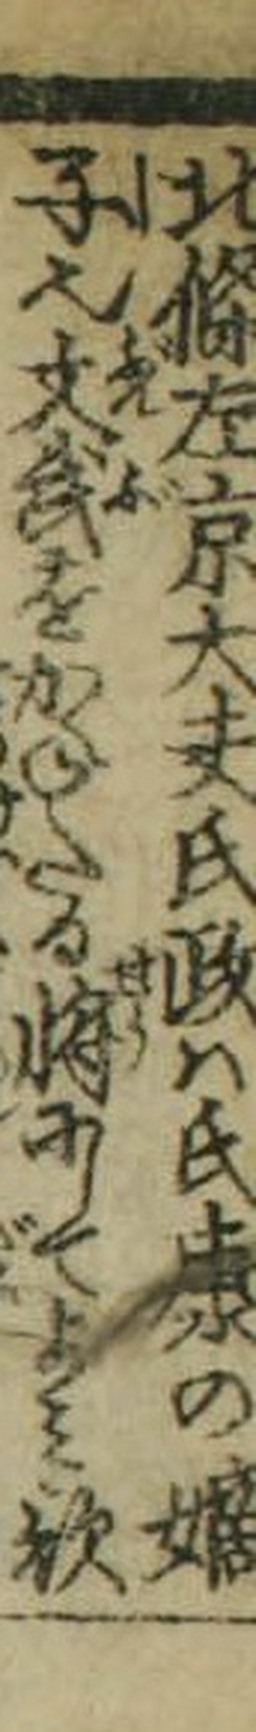子也文武をかねたる将にしてよみ歌
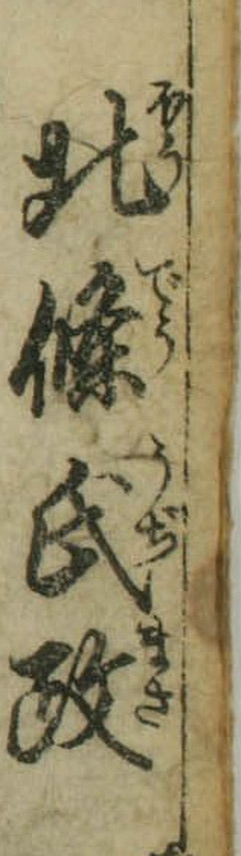北條氏政
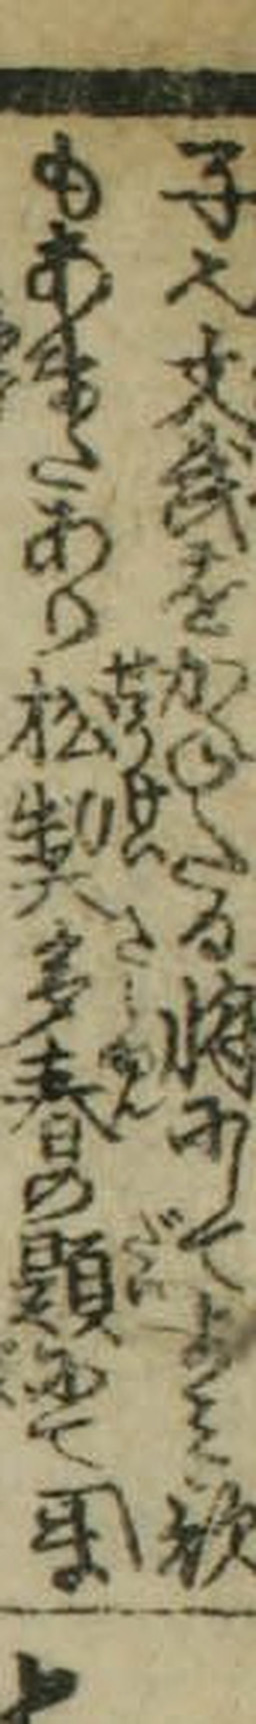もあまたあり松契多春の題にて〽ま
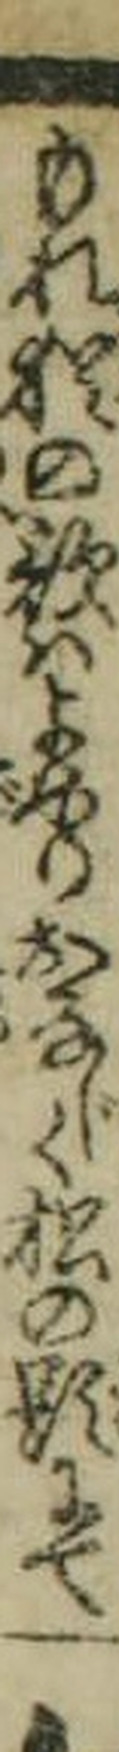もれ猶の歌はよめりおなじく松の題にて
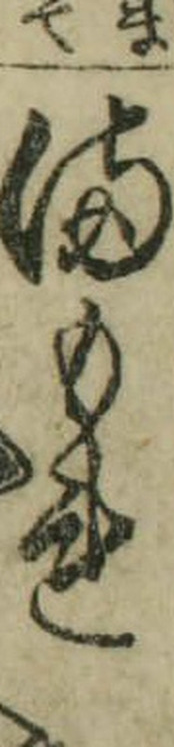まもれ
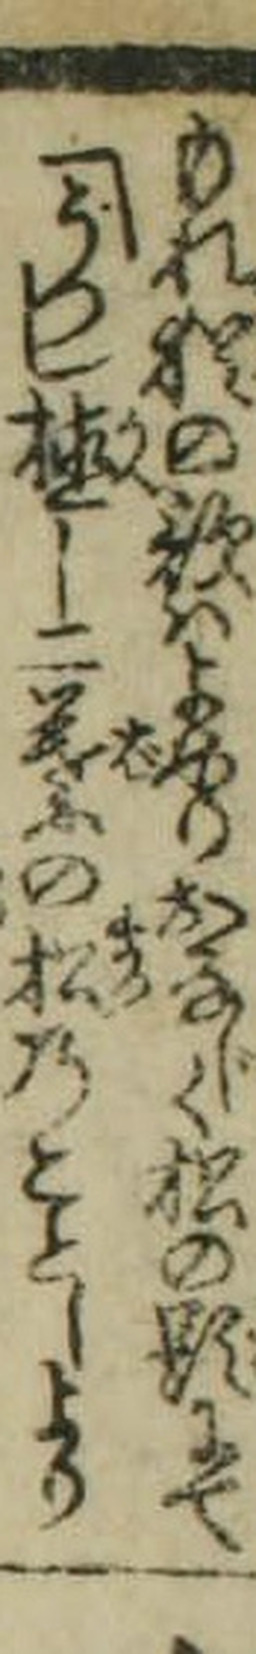〽うつし植し二葉の松のことしより
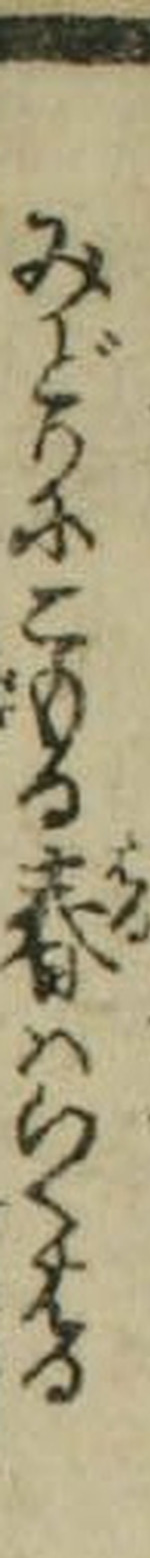みどりにこもる春はいくはる
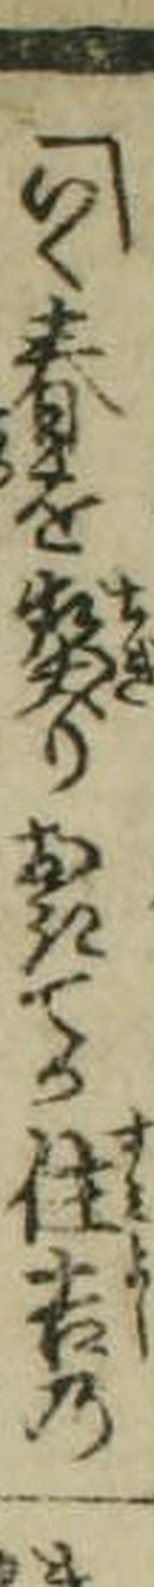〽いく春を契りおきてか住吉の
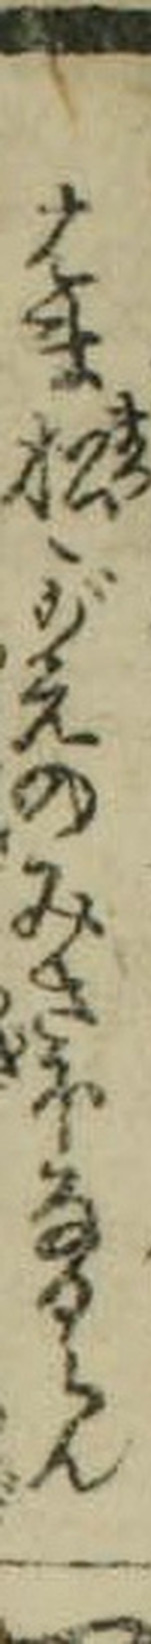はま松がえのみさほなるらん
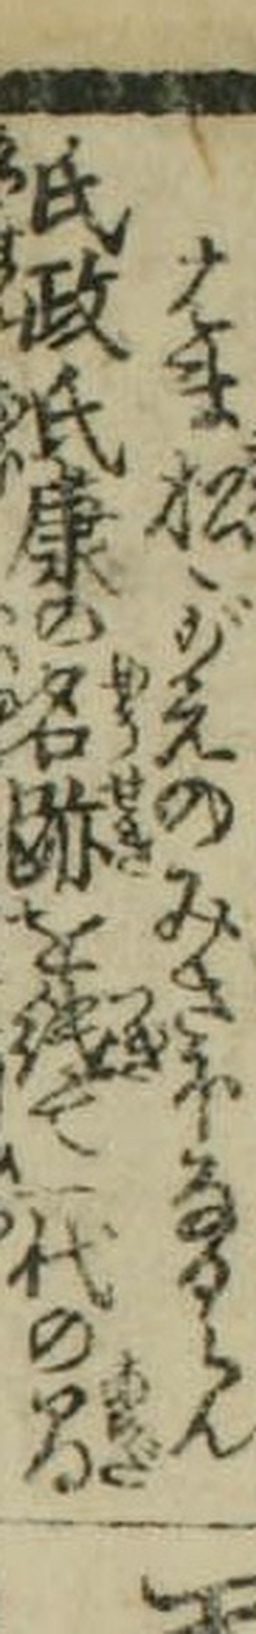氏政氏康の名跡を継て一代の間
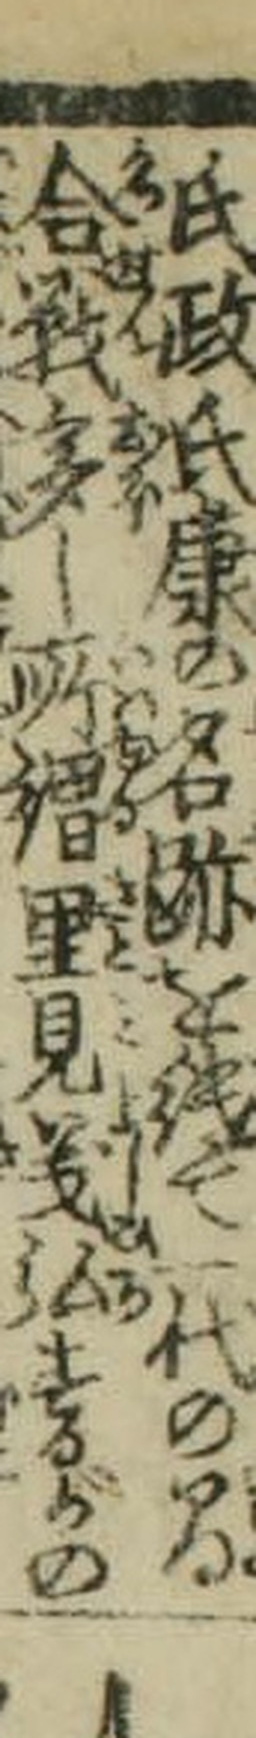合戦多し所謂里見義弘するがの
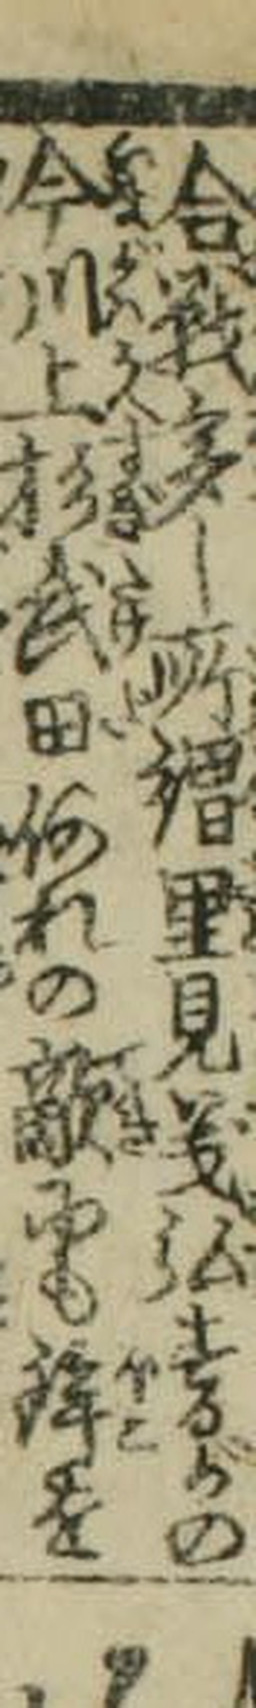今川上杉武田何れの歒にも鉾を
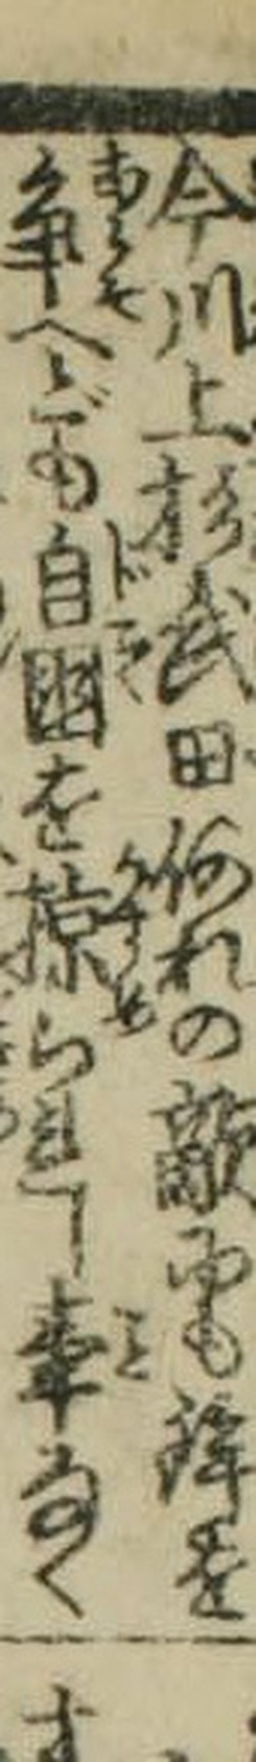争へども自国を掠られし事なく
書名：續英雄百人一首
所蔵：東京学芸大学附属図書館
